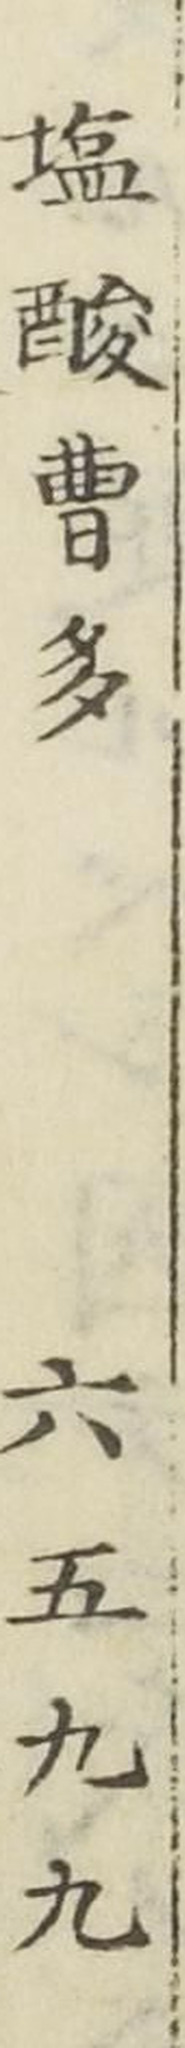塩酸曹多六五九九
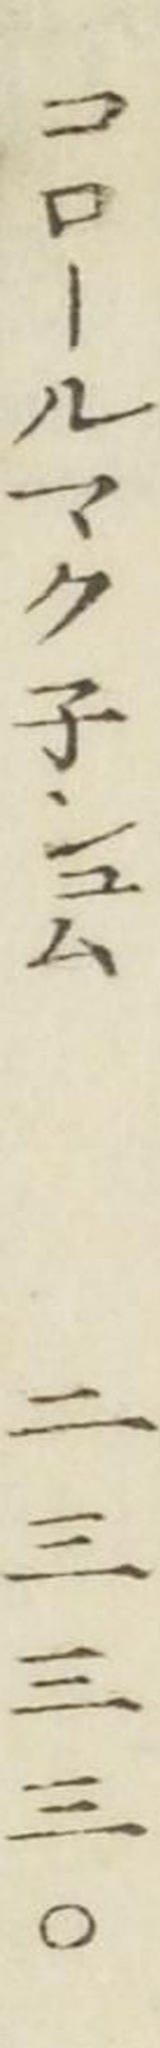コロールマクネシュム二三三三〇
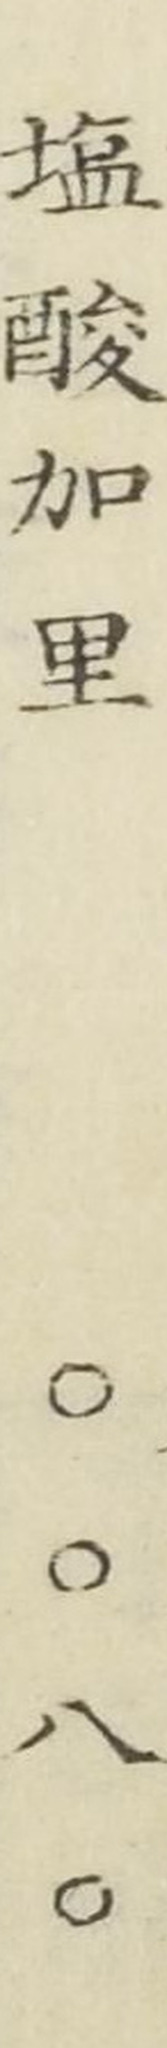塩酸加里〇〇八〇
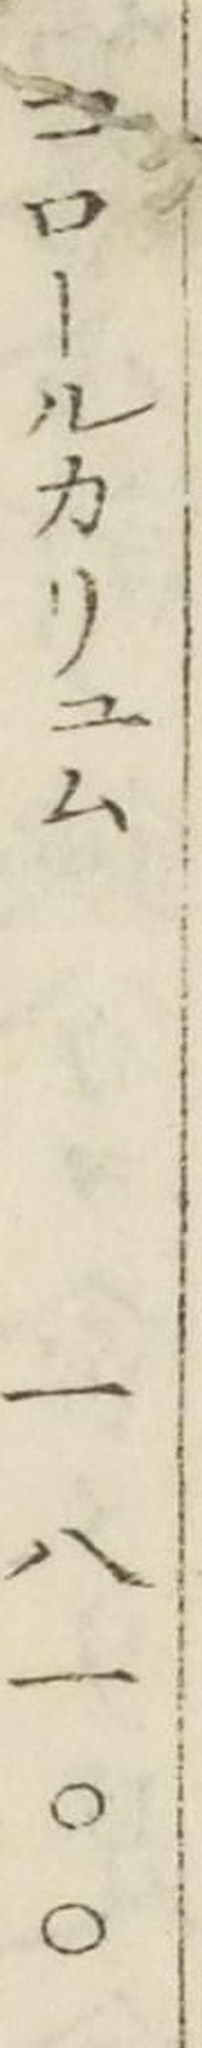コロールカリュム一八一〇〇
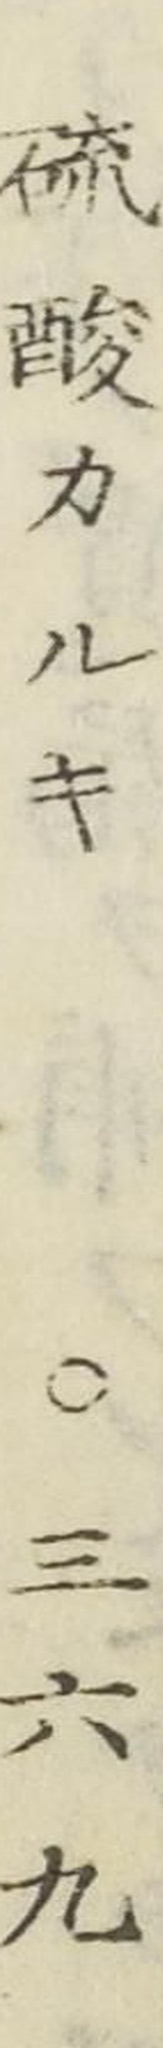硫酸カルキ〇三六九
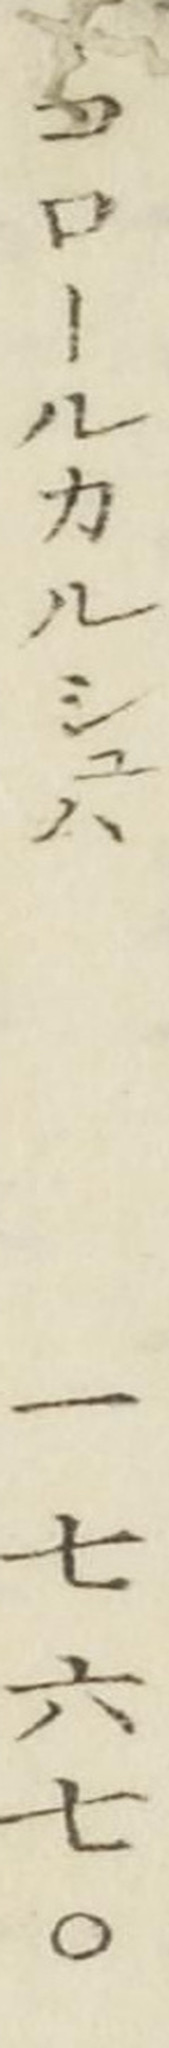コロールカルシュム一七六七〇
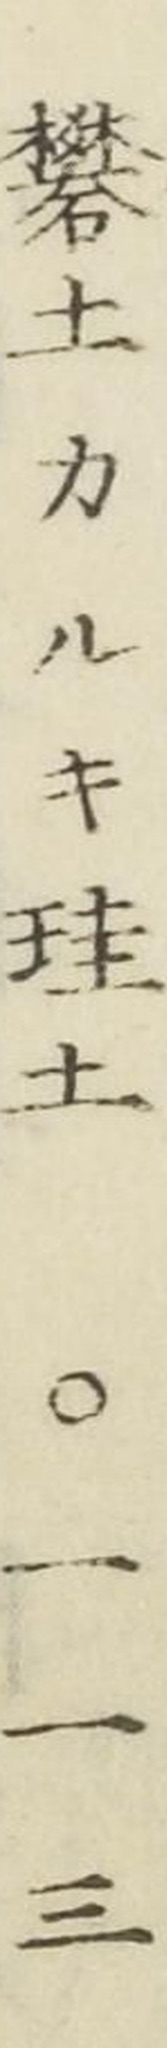礬土カルキ珪土〇一一三
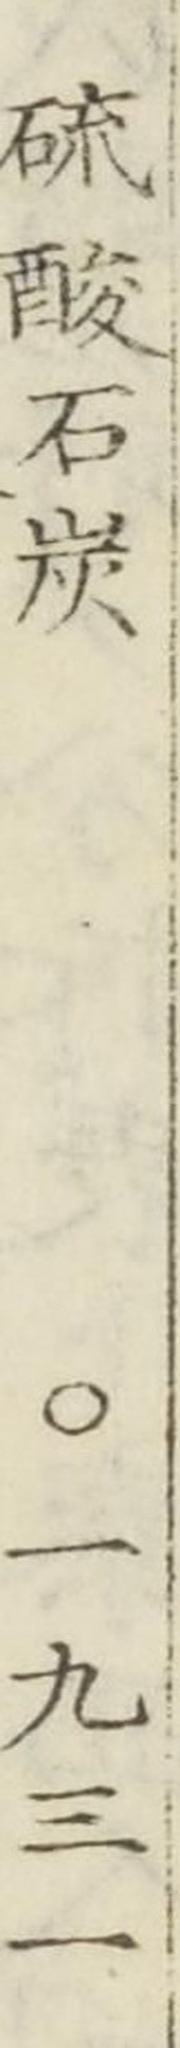硫酸石炭〇一九三一
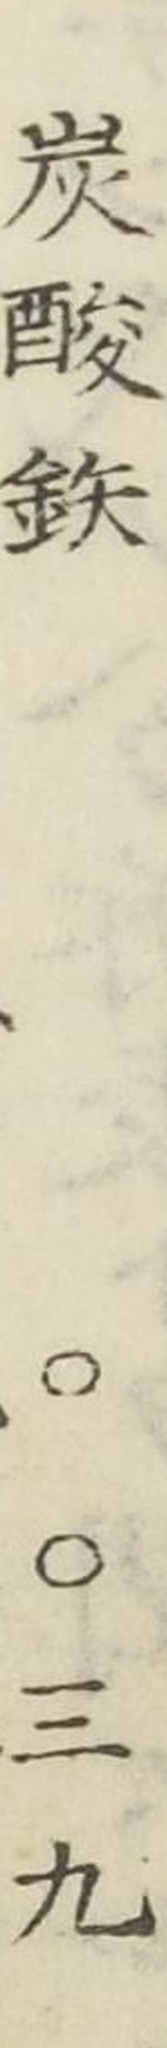炭酸鉄〇〇三九
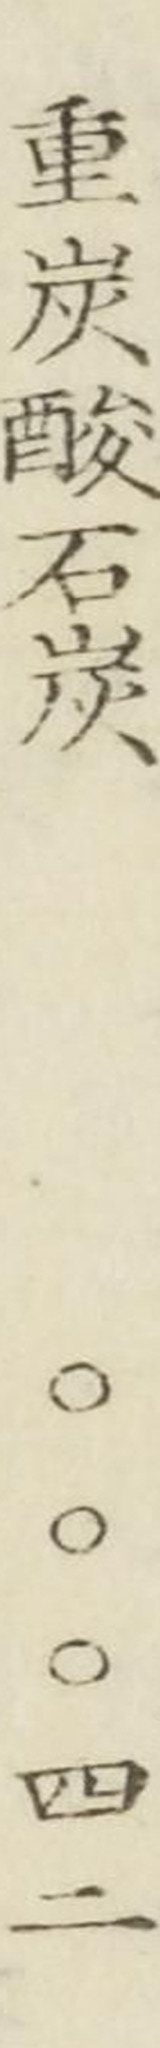重炭酸石炭〇〇〇四二
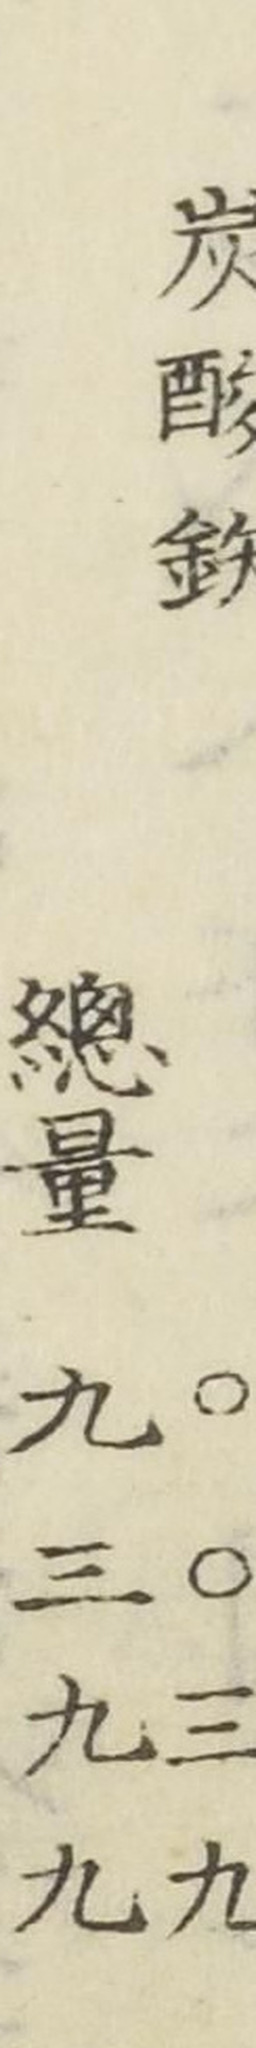総量九三九九
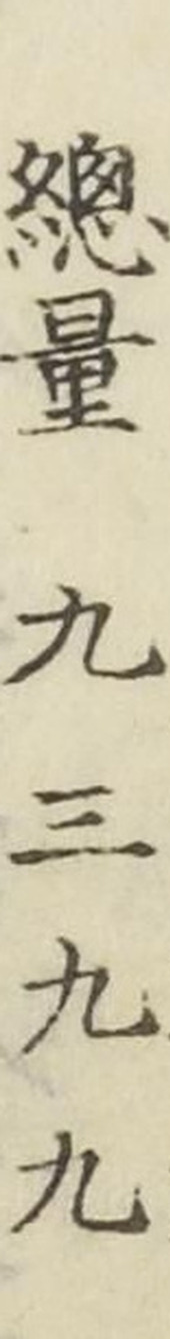総量九三九九
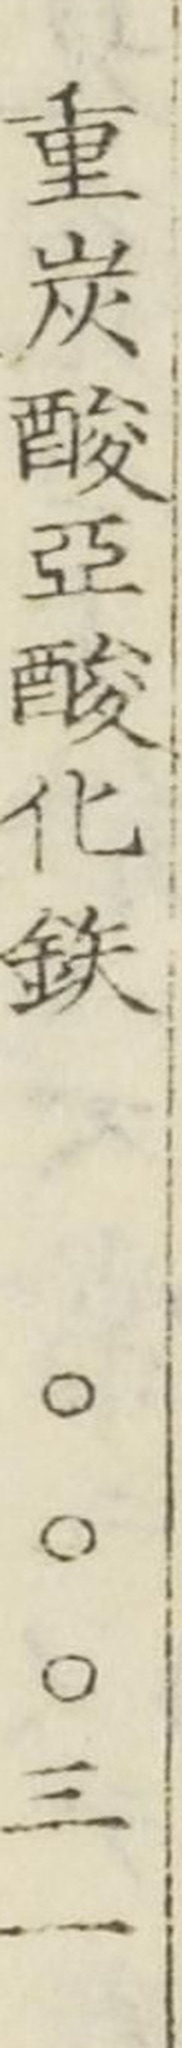重炭酸亜鉛化鉄〇〇〇三一
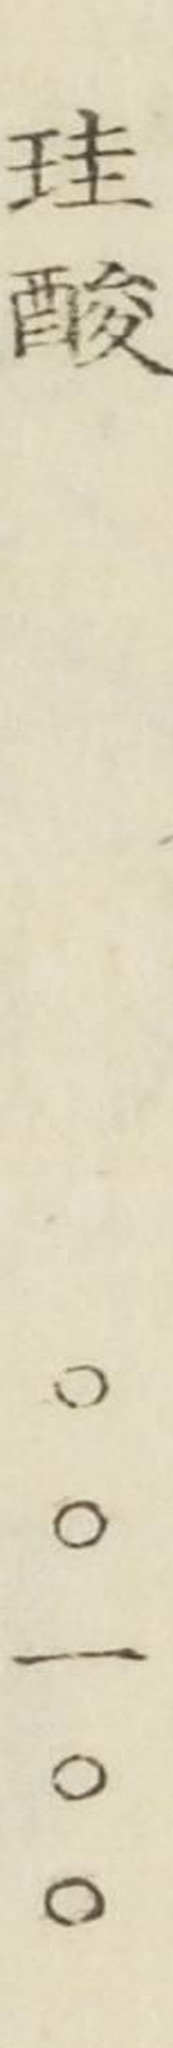珪酸〇〇一〇〇
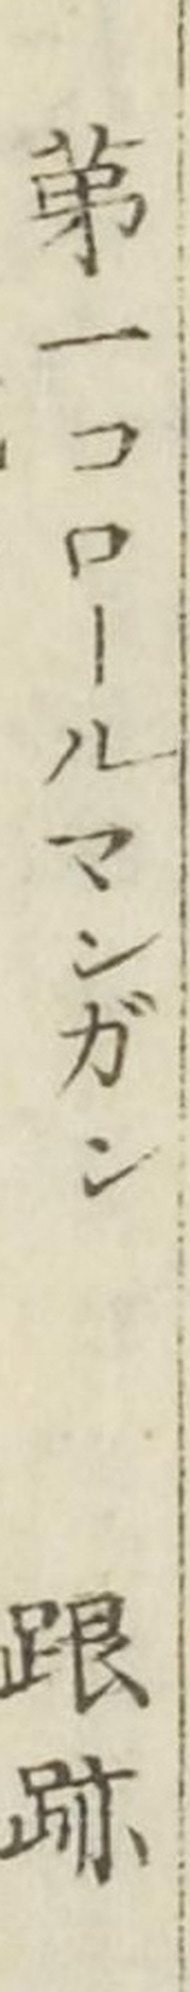第一コロールマンガン跟跡
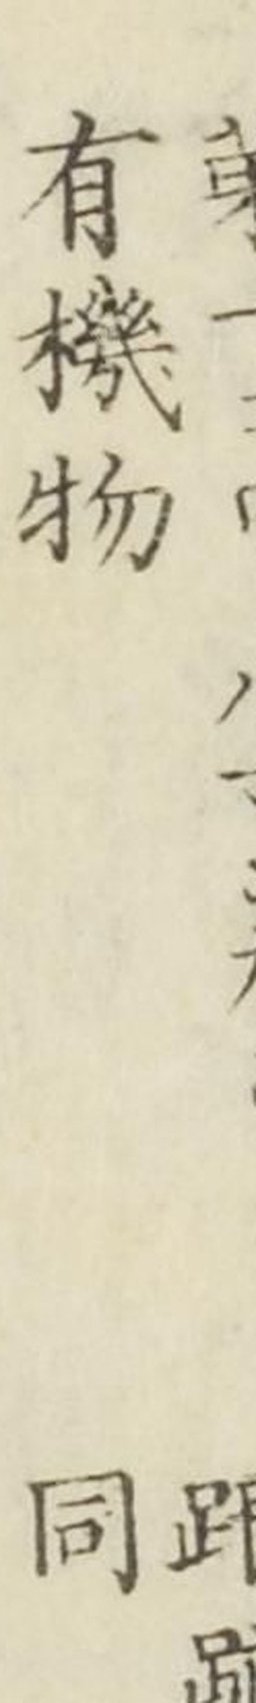有機物同
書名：熱海温泉考　全
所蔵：東京大学地震研究所図書室 Earthquake Research Institute Library, The University of Tokyo, JAPAN
